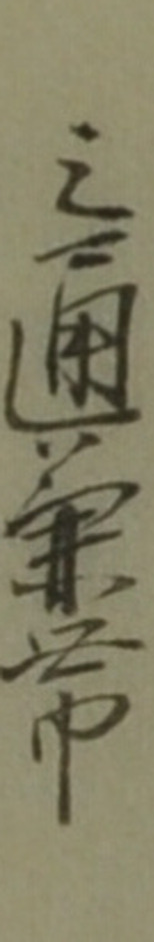之通兼帯
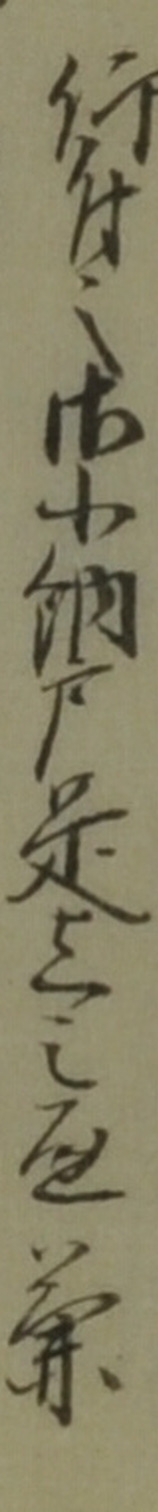番被仰付之御小納戸是迄之通兼
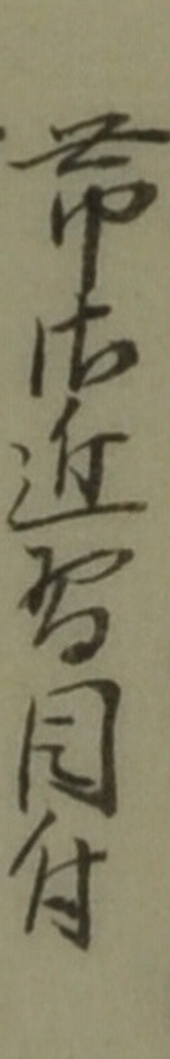帯御近習目付
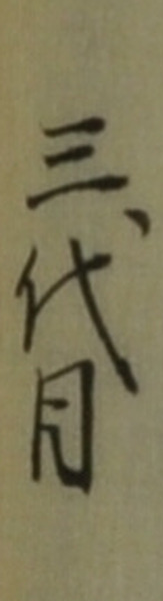三代目
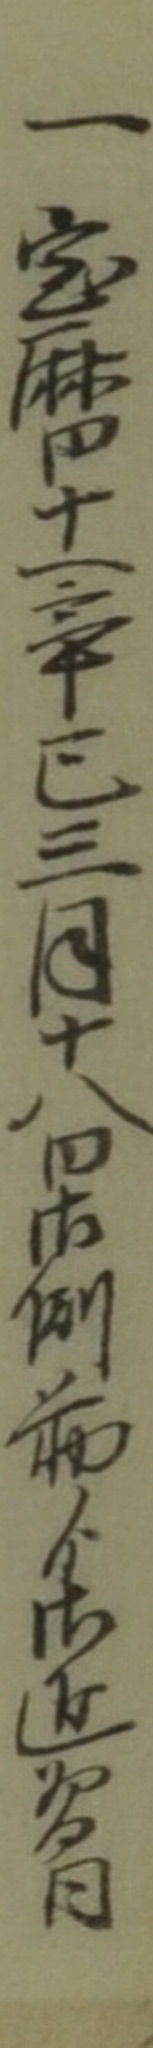一宝暦十一辛巳三月十八日御側勤ゟ御近習目
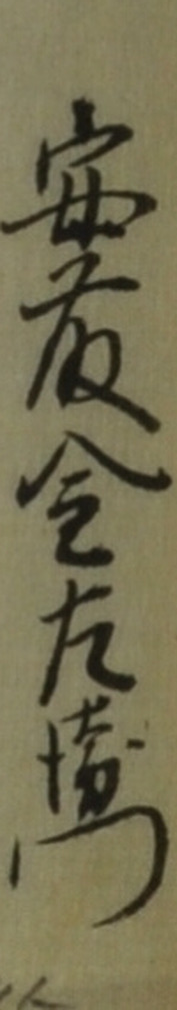安藤金左衛門
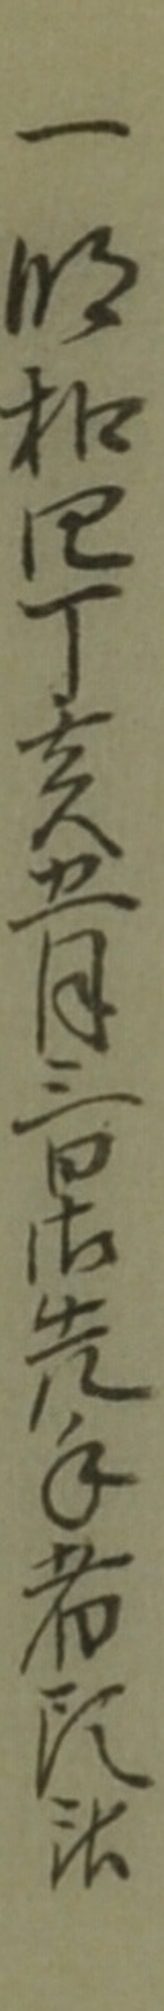一明和四丁亥五月三日御先手者頭被
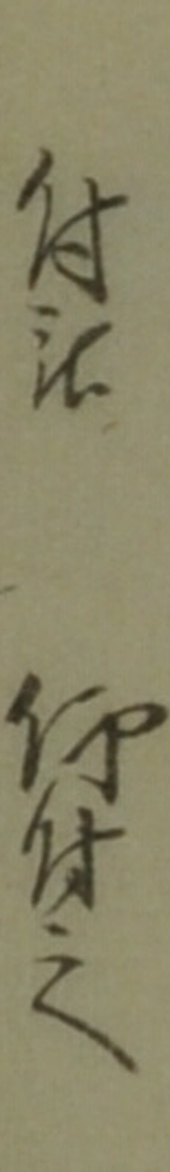付被仰付之
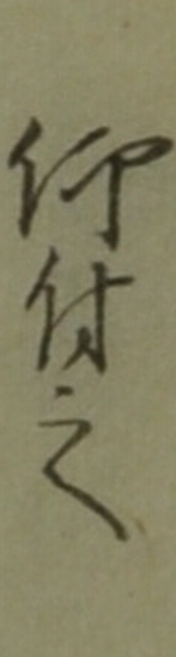仰付之
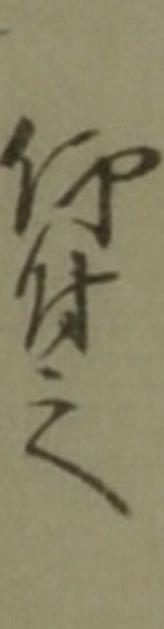仰付之
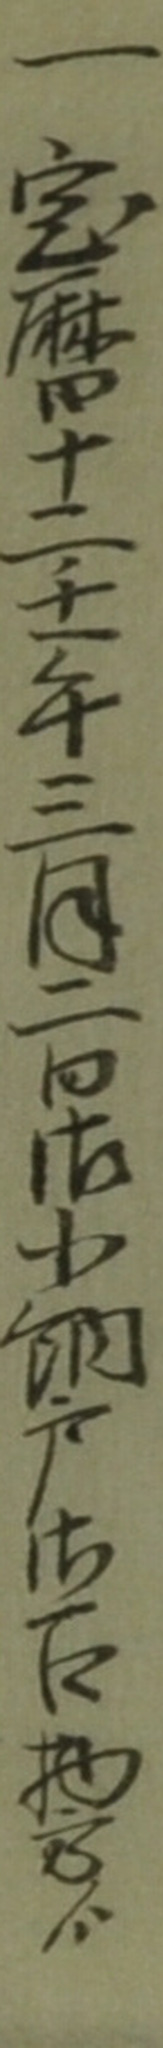一宝暦十二壬午三月二日御小納戸御召物方ゟ
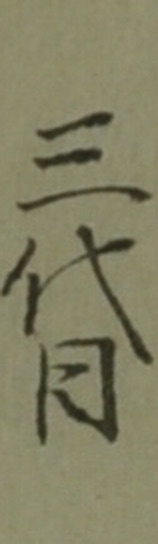三代目
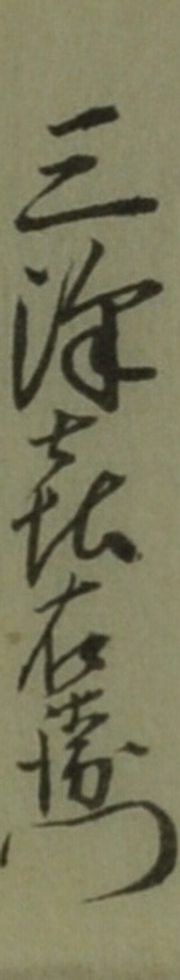三沢喜右衛門
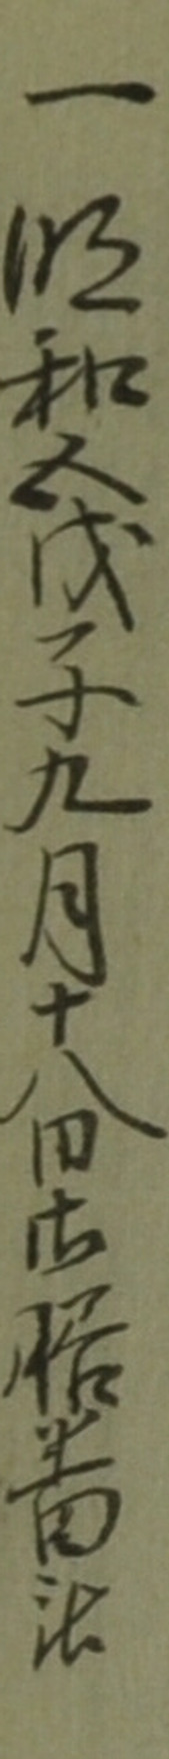一明和五戊子九月十八日御膳番被
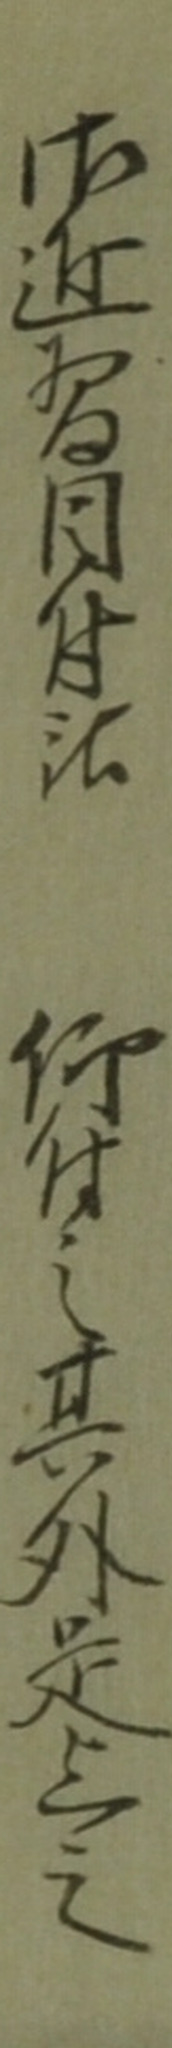御近習目付被仰付之其外是迄之
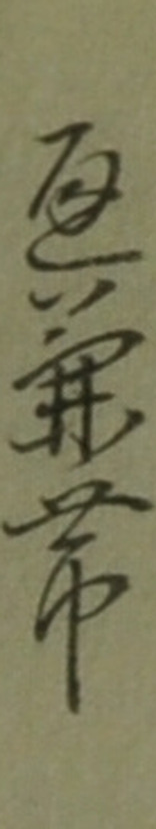通兼帯
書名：諸御役代々録（四）
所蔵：伊那市立高遠町図書館・合同会社AMANE
